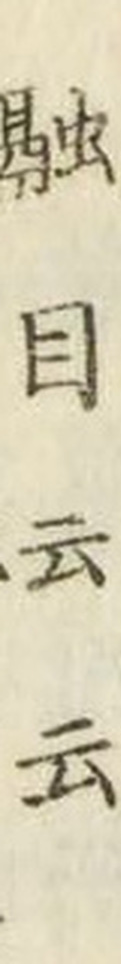融目云云
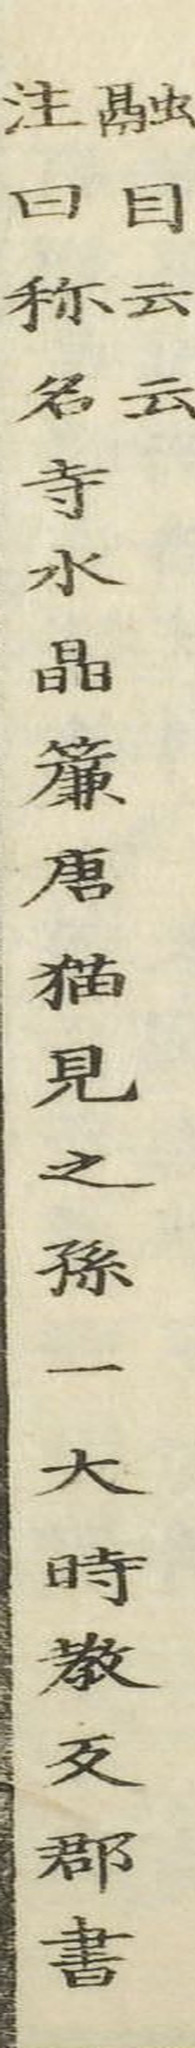注曰称名寺水晶簾唐猫見之孫一大時教反郡書
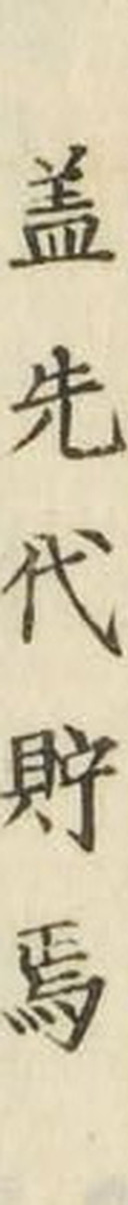盖先代貯焉
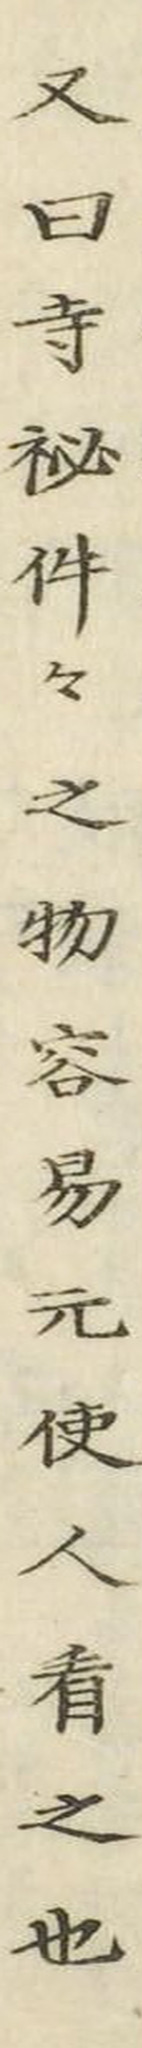又曰寺秘件々之物容易元使人看之也
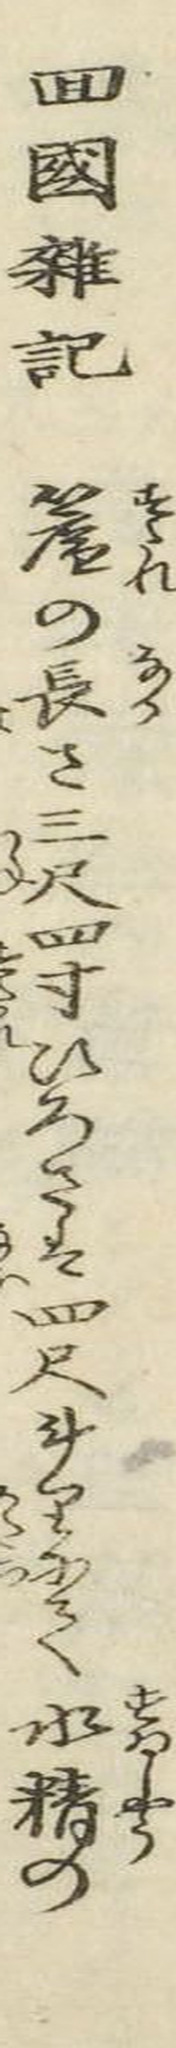回國雜記簾の長さ三尺四寸ひろさは四尺斗りにて水精の
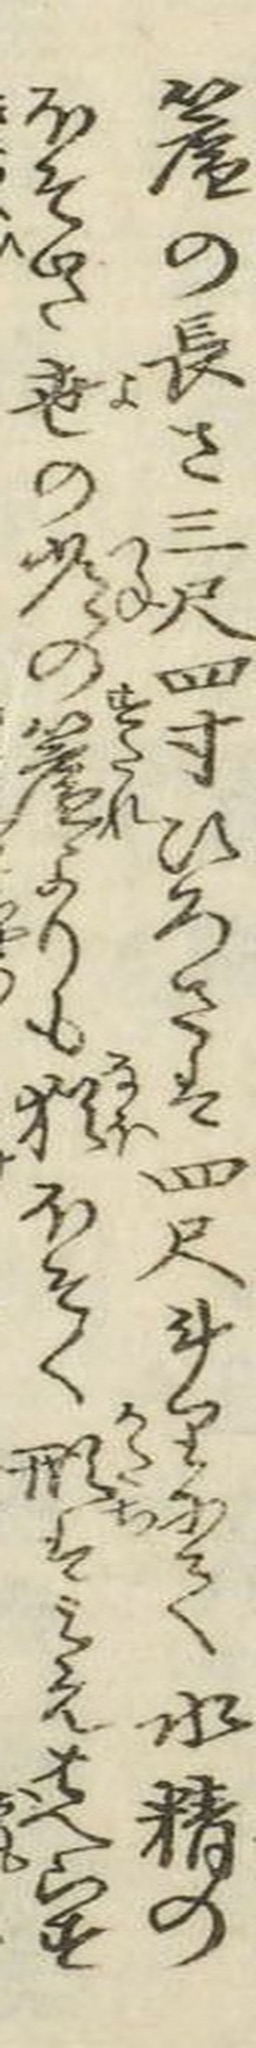ほそさ世の常の簾よりも猶ほそく形はみえはへらす
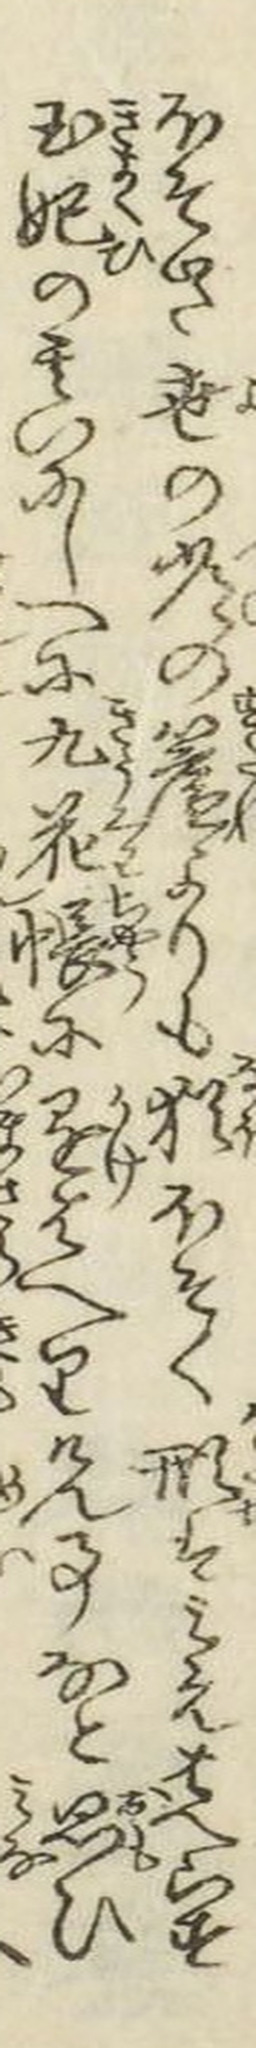玉妃の其いにしへに九花帳に懸はへりけん事なと思ひ
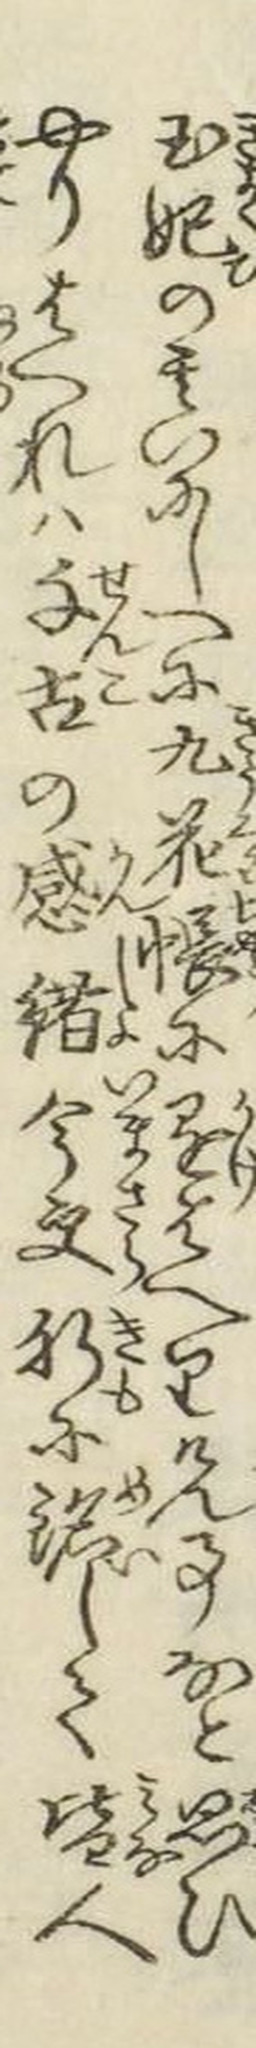やりはへれは千古の感緒今更肝に銘して皆人
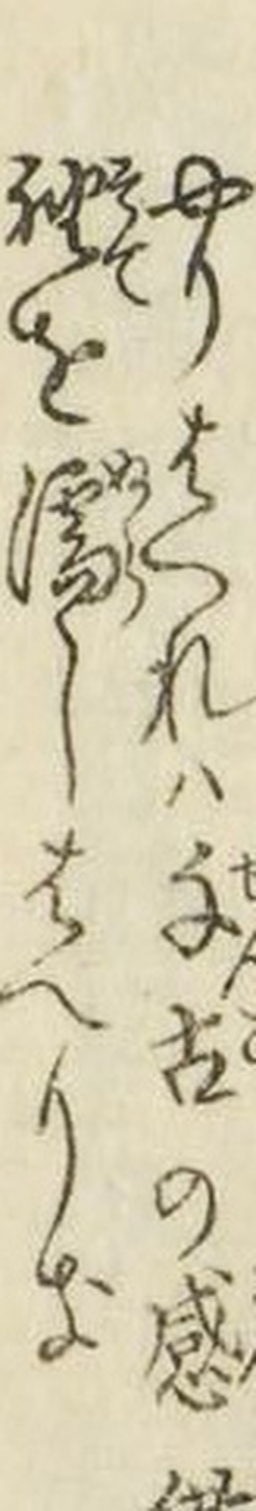袖を濡しはへりき
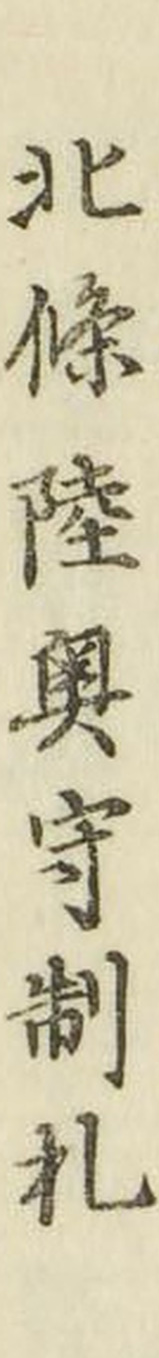北條陸奥守制札
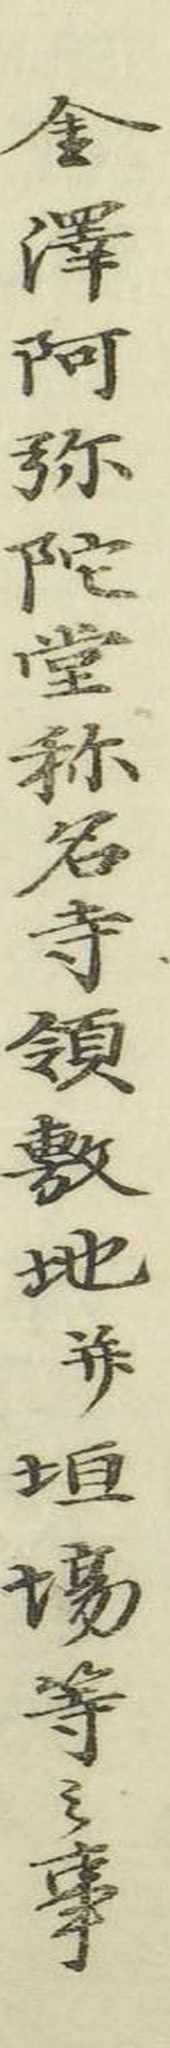金澤阿弥陀堂称名寺領敷地幷垣塲等之事
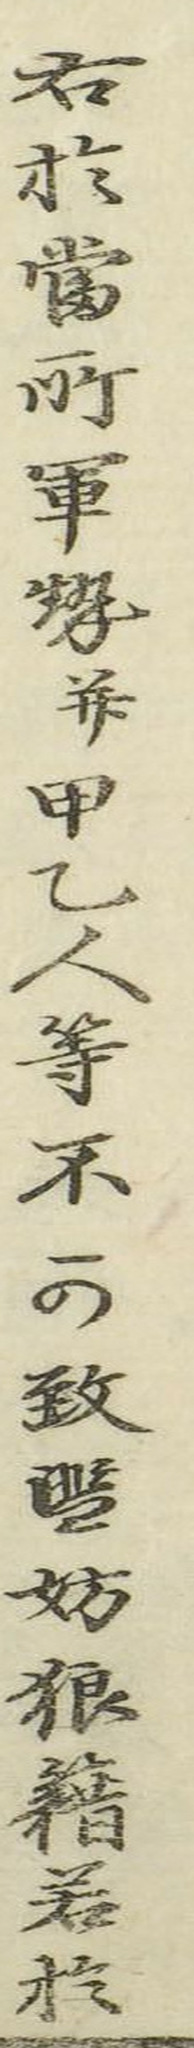右於當所軍㔟幷甲乙人等不可致監妨狼藉若於
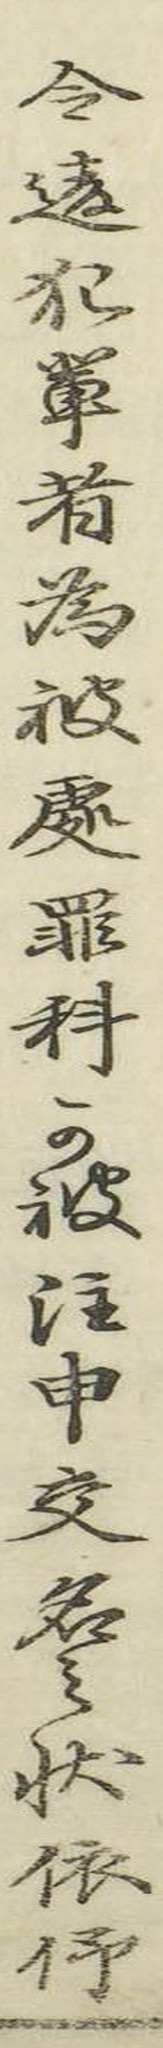令違犯軰者為被處罪科可被注申交名之状依仰
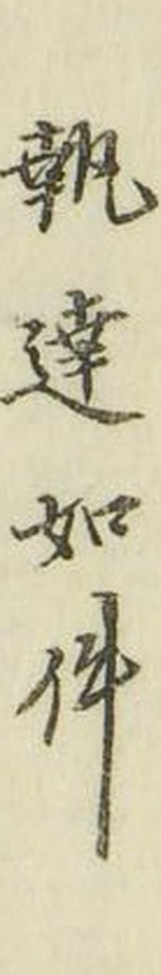執達如件
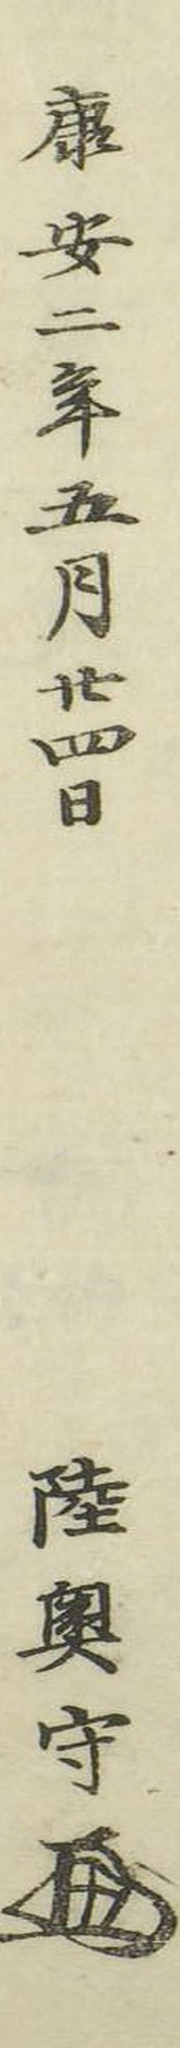康安二年五月廿四日陸奥守
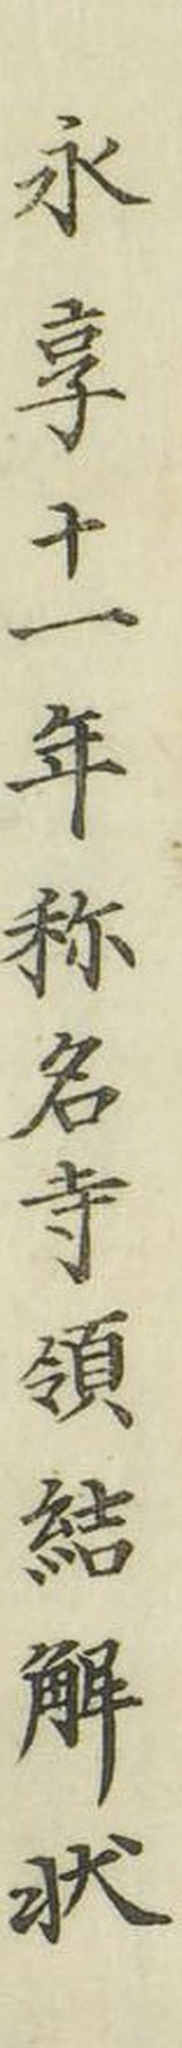永享十一年称名寺領結解状
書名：江戸名所図会 20巻 巻之6
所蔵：東京学芸大学教育コンテンツアーカイブ
